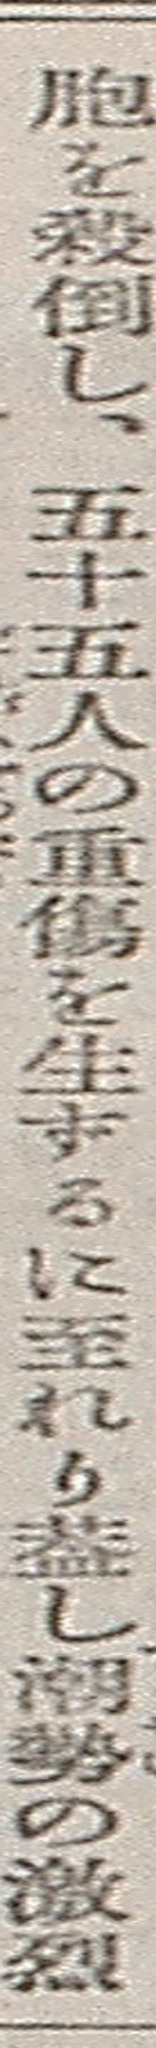胞を殺倒し、五十五人の重傷を生ずるに至れり蓋し潮勢の激烈
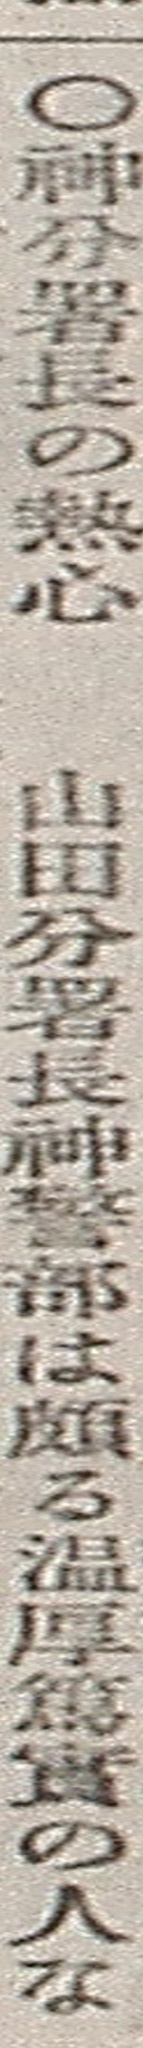○神分署長の熱心山田分署長神警部は頗る温厚篤実の人な
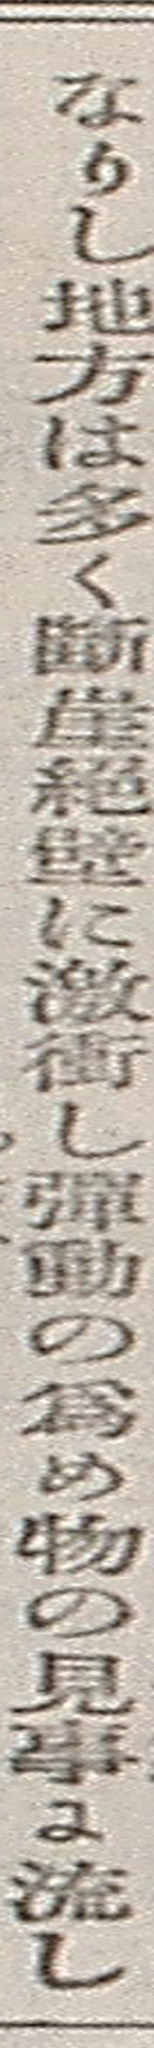なりし地方は多く断崖絶壁に激衝し弾動の為め物の見事に流し
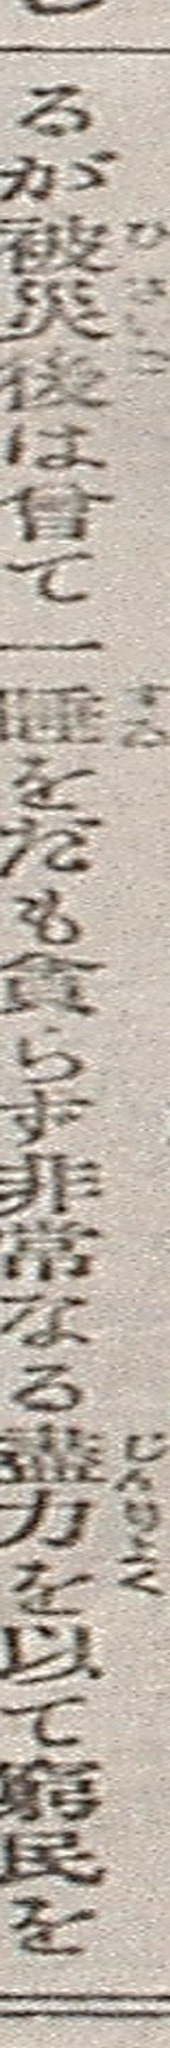るが被災後は曾て一睡をだも貪らず非常なる尽力を以て窮民を
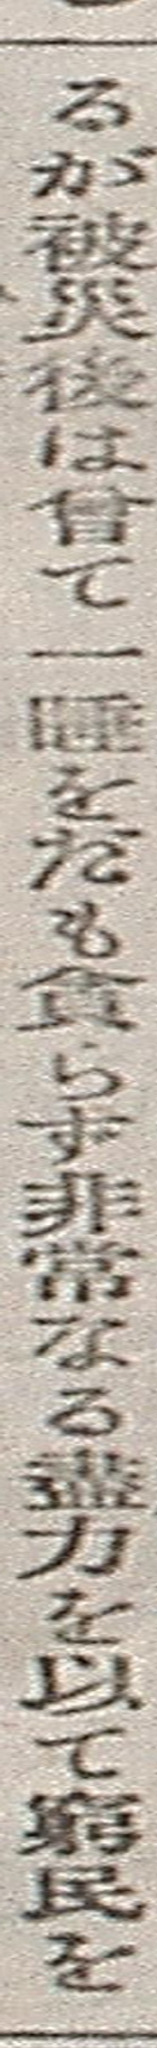るが被災後は曾て一睡をだも貪らず非常なる尽力を以て窮民を
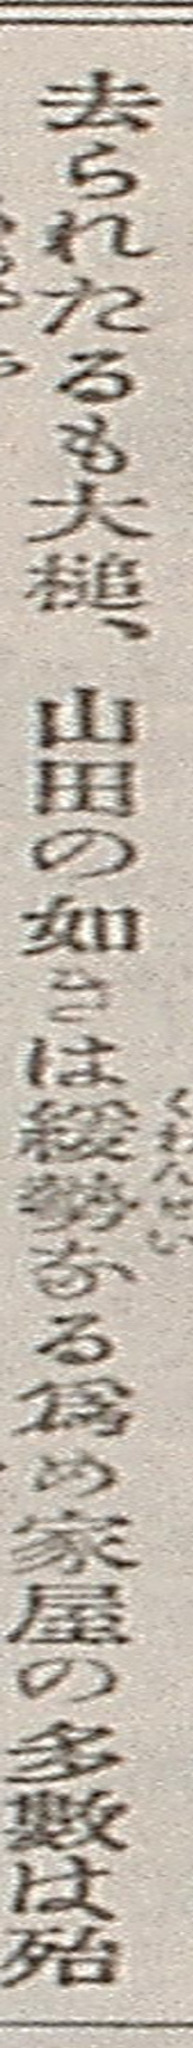去られたるも大槌、山田の如きは緩勢なる為め家屋の多数は殆
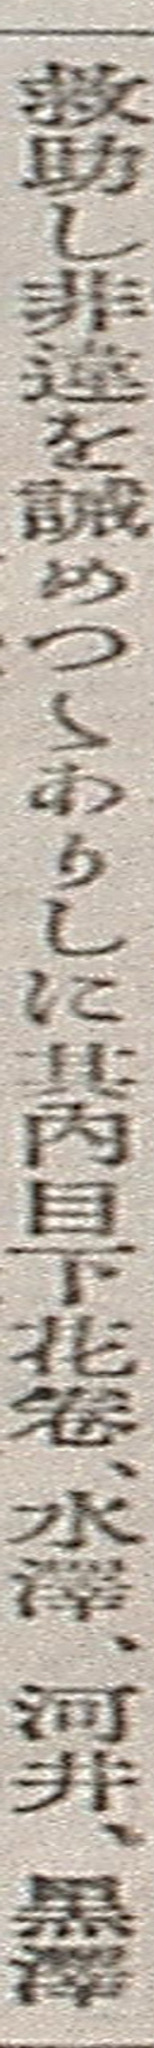救助し非違を誡めつゝありしに其内目下花巻、水沢、河井、黒沢
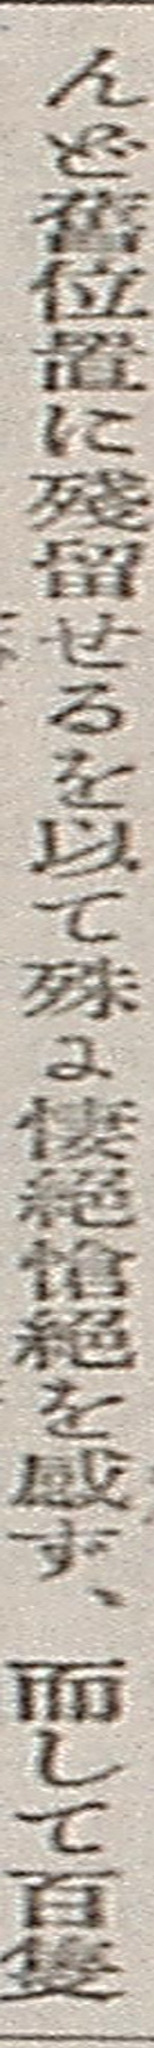んど旧位置に残留せるを以て殊に凄絶愴絶を感ず、而して百隻
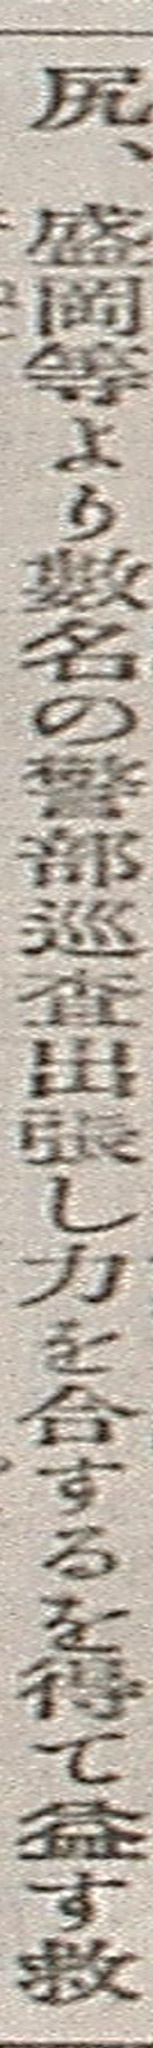尻、盛岡等より数名の警部巡査出張し力を合するを得て益す救
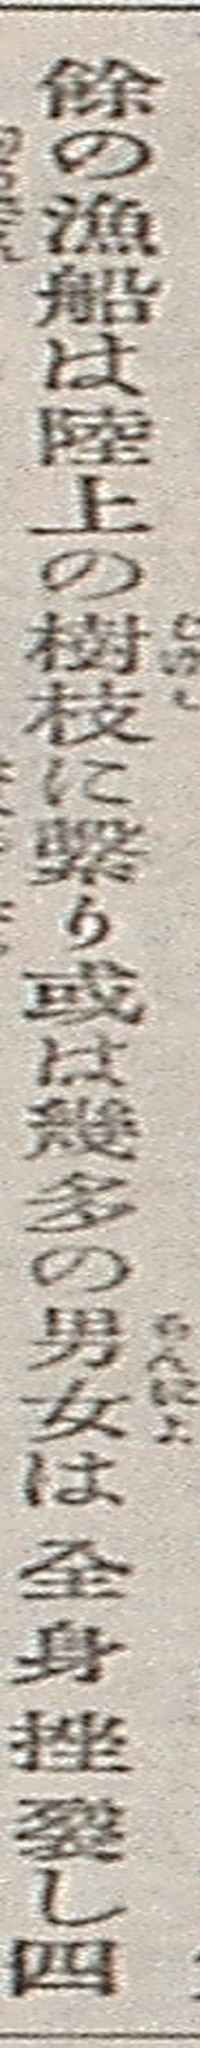余の漁船は陸上の樹枝に繋り或は幾多の男女は全身挫裂し四
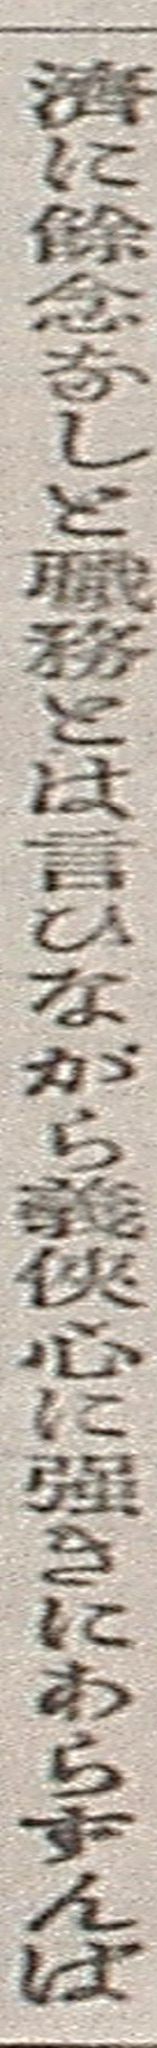済に余念なしと職務とは言ひながら義侠心に強きにあらずんば
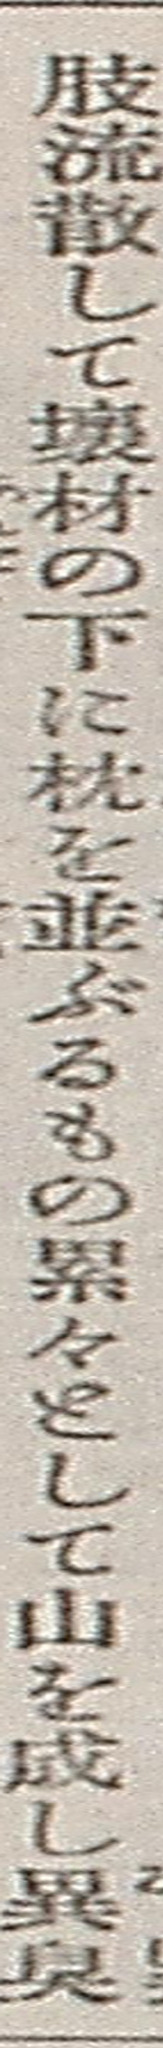肢流散して壊材の下に枕を並ぶるもの累々として山を成し異臭
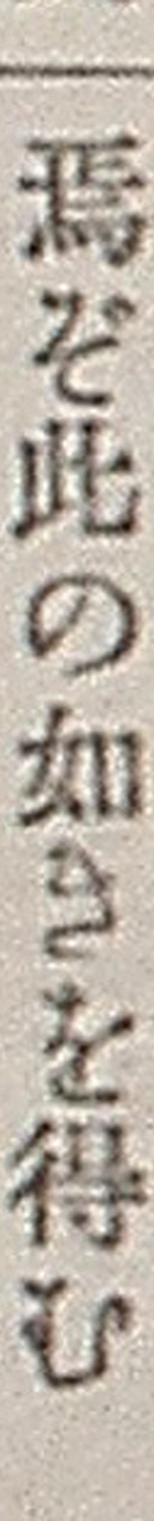焉ぞ此の如きを得む
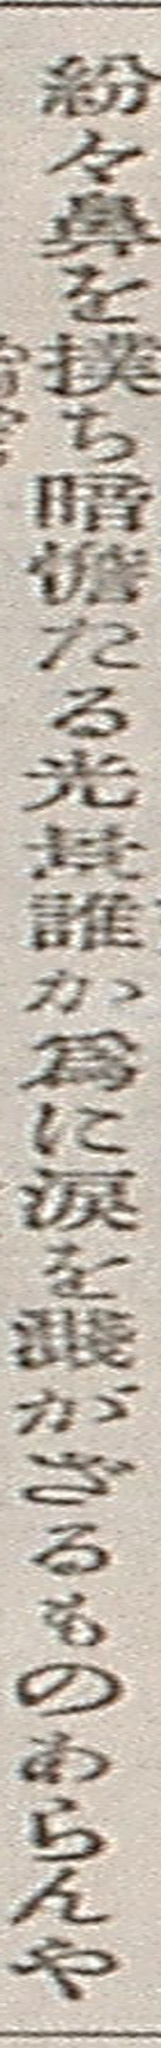紛々鼻を撲ち暗澹たる光景誰か為に涙を濺がざるものあらんや
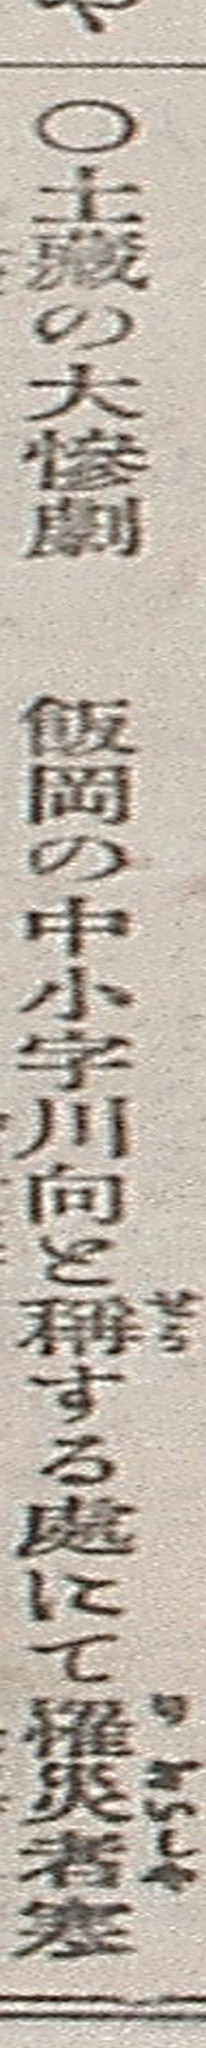○土蔵の大惨劇飯岡の中小字川向と称する処にて罹災者寒
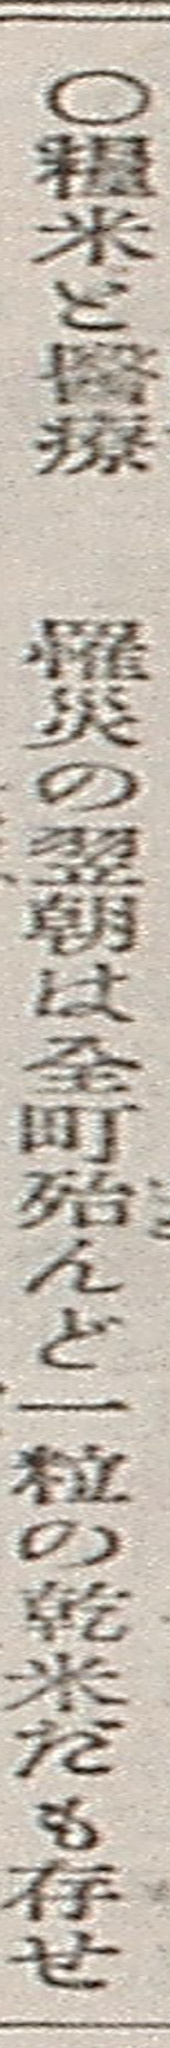○糧米と医療罹災の翌朝は全町殆んど一粒の乾米だも存せ
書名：風俗畫報臨時増刊第百十九號　大海嘯被害録（中）
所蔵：東京大学地震研究所図書室 Earthquake Research Institute Library, The University of Tokyo, JAPAN
